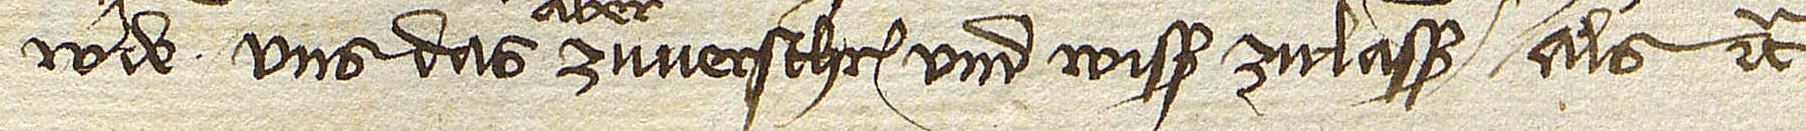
w*de . vns das ʒuuerſchr* vnd wiſſ* ʒulaſſ* / als ec*
